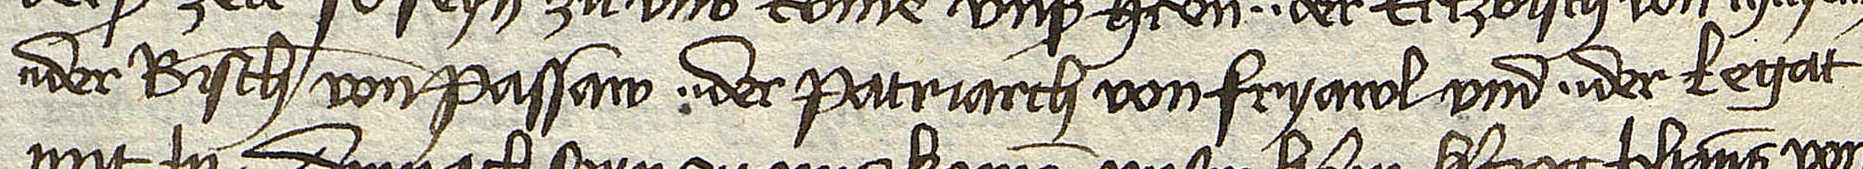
~ der Biſch* von Paſſaw ~ der Patriarch von fryawl vnd ~ der Legat
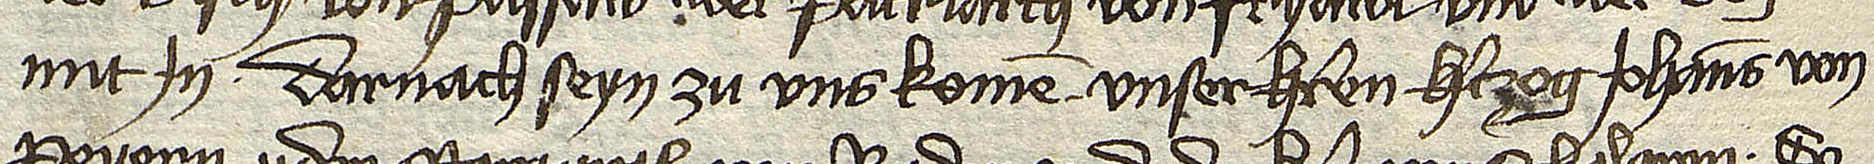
mit In . Darnach ſeyn ʒu vns kome* ~ vnſer hr*en h*cʒog Iohans* von
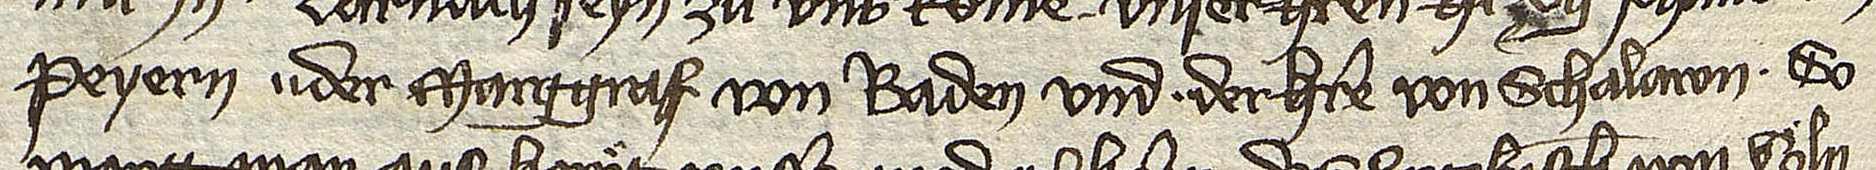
Peyern ~ der Marggraf von Baden vnd ~ der h*re von Schalawn . So
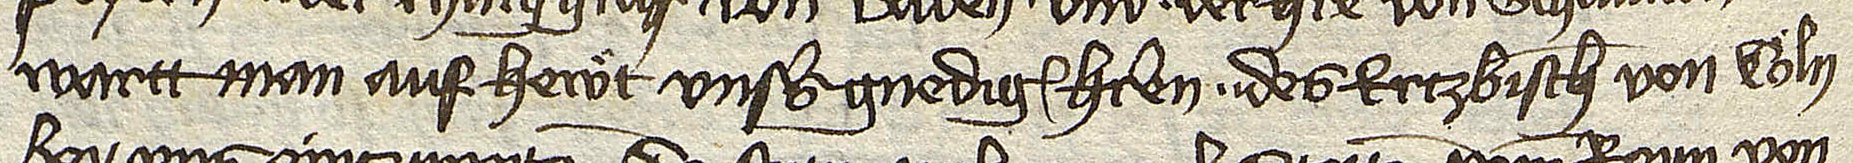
wartt man auf heẅt vnſs* gnedig* hr*en ~ des Ercʒbiſch* von Cöln
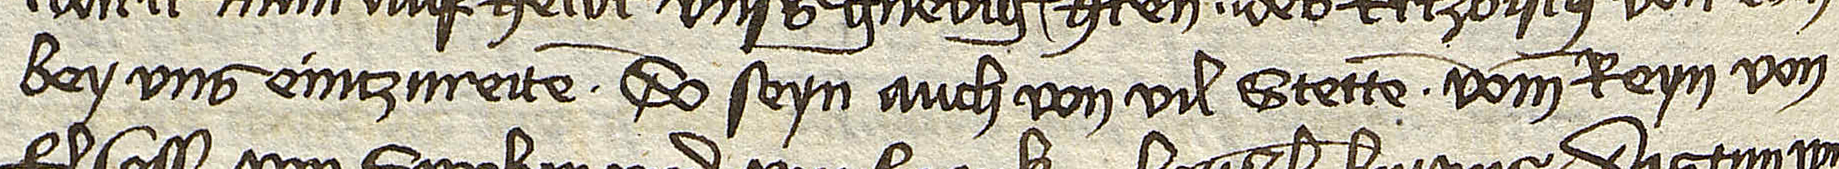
bey vns eincʒureite* . So ſeyn auch von vil Stette* vom Reyn von
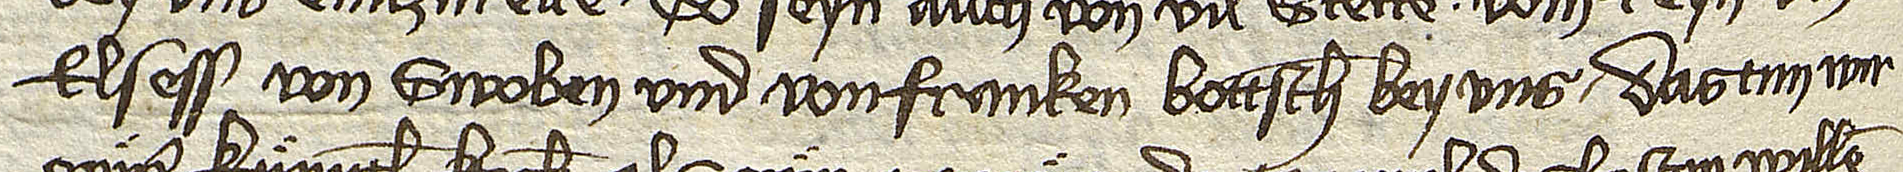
Elſeſſ von Swoben vnd von franken bottſch* bey vns / Das tun wir
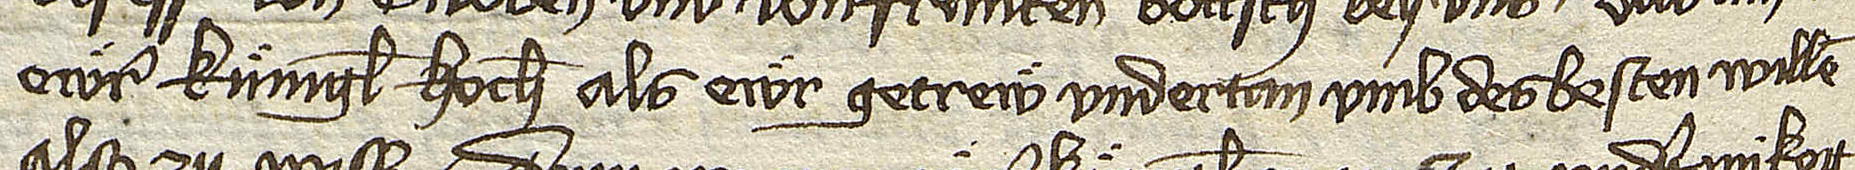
eẅr künigl* hoch* als eẅr getreẅ vndertan vmb des beſten wille*
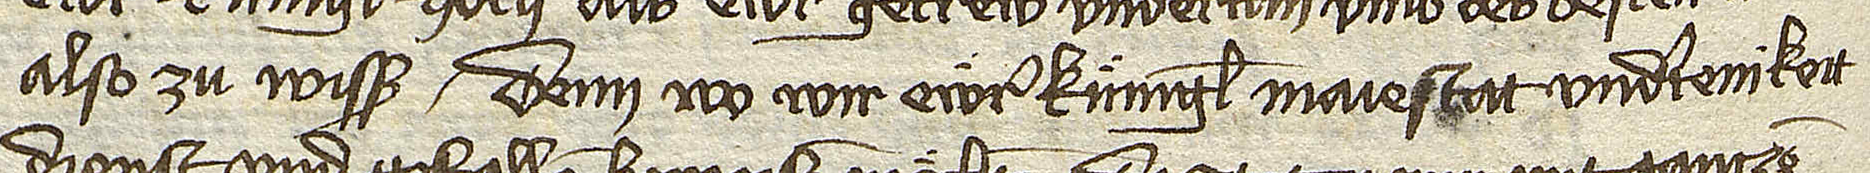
alſo ʒu wiſſ* / Denn wo wir eẅr* künigl* maieſtat vnd*tenikeit
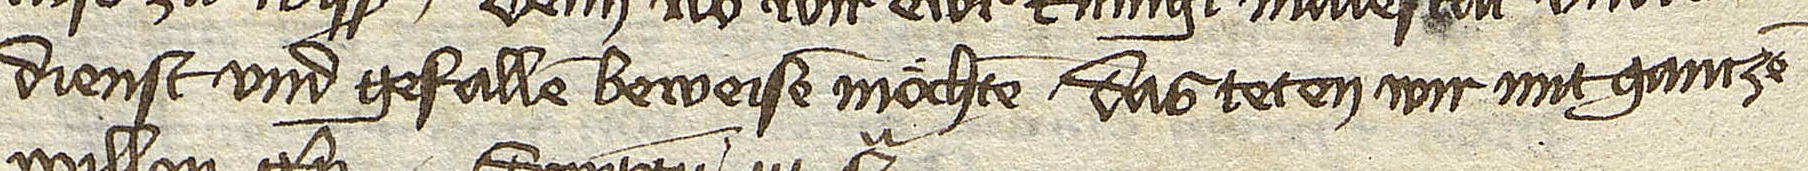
dienſt vnd gefalle* beweiſe* möchte* / Das teten wir mit gancʒe*
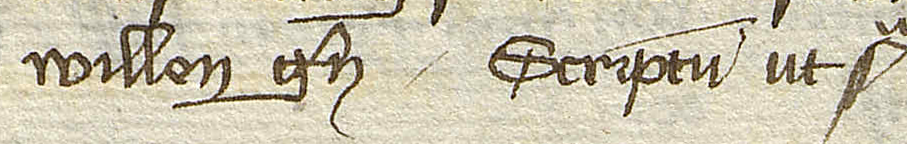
willen g*n / Scriptu* ut ſ*
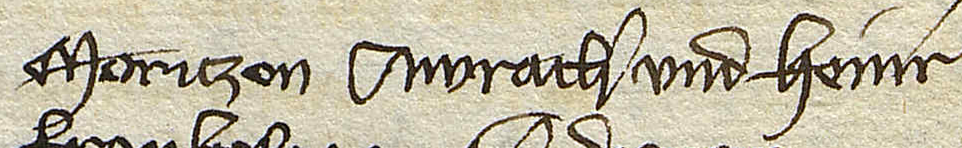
Moricʒen Awrach* vnd Heinr*
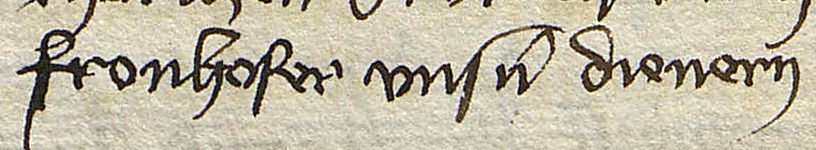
fronhofer vnſn* dienern
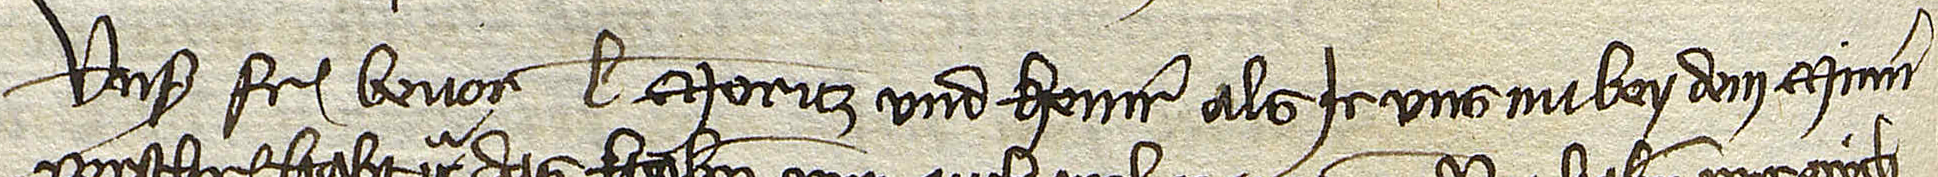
Vnſ* fr* beuor l* Moricʒ vnd Heinr* als Ir vns nu bey dem Minn*
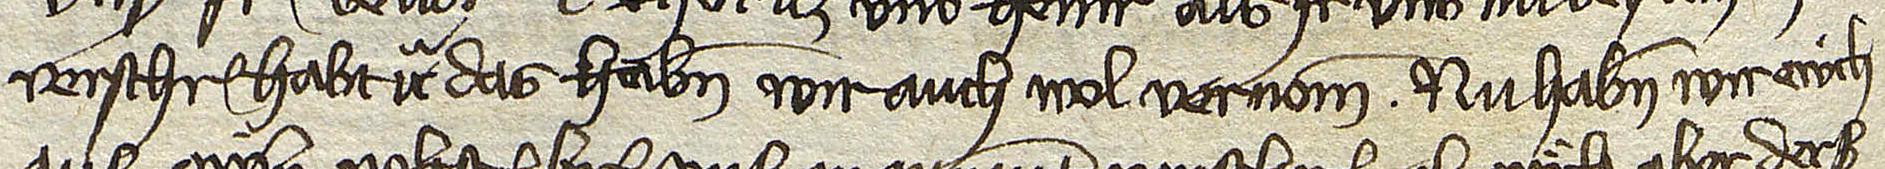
verſchr* habt ec* das habn* wir auch wol vernom* . Nu habn* wir eẅch
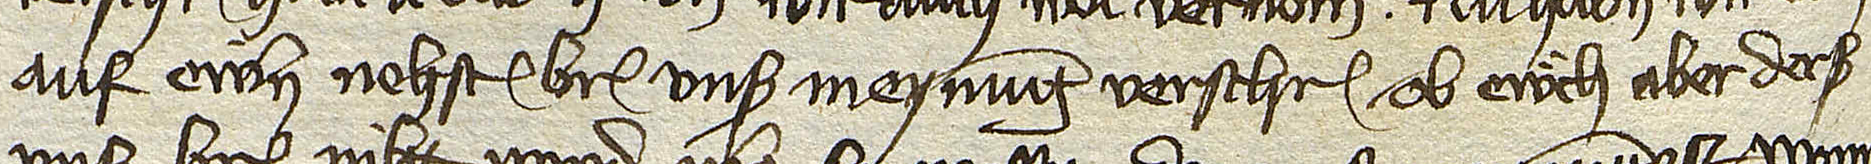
auf eẅn* nehſt* br* vnſ* meynug* verſchr* / ob eẅch aber derſ*
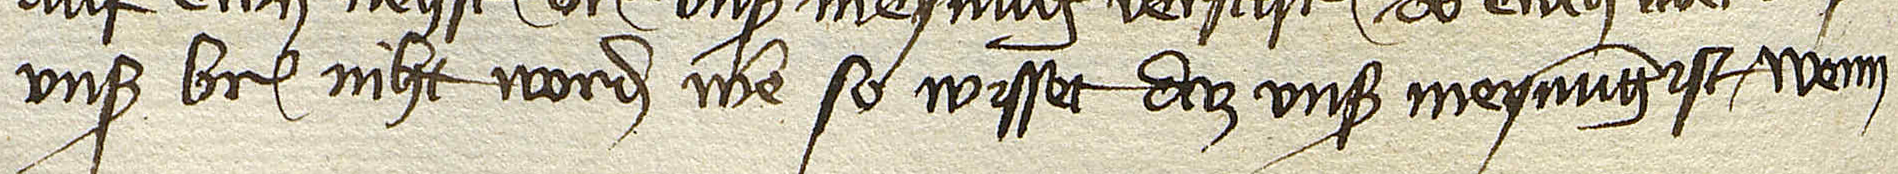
vnſ* br* niht word* w*e ſo wiſſet daʒ vnſ* meynug* iſt / wenn
